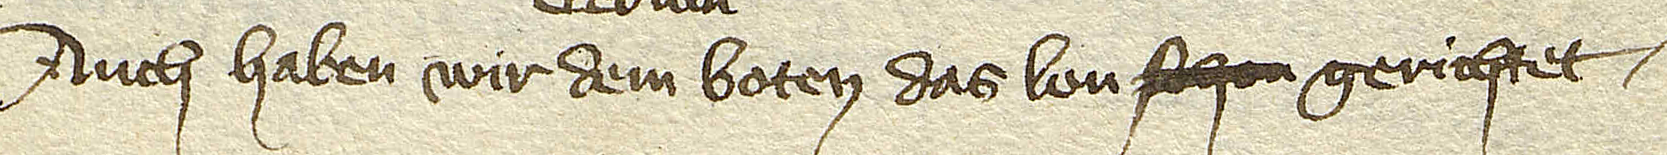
Auch haben wir dem boten das lon ſchon gerichtet /
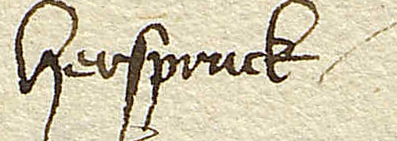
herſpruck /
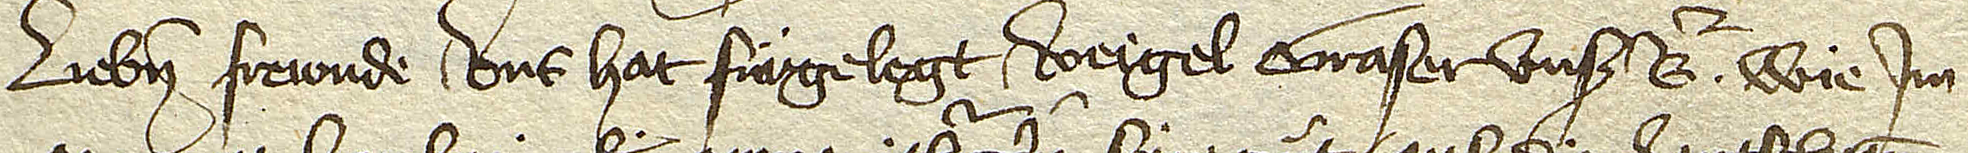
Liebn* frewnde / vns hat fürgelegt / weigel Graſer vnſ* B* . wie Im
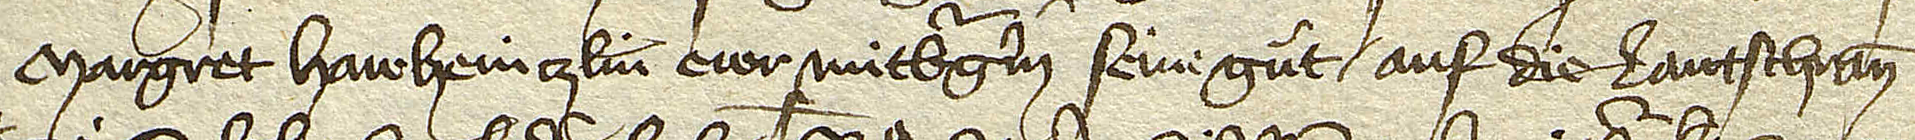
Margret hawheincʒlin ewr mitb*g*in ſeine güt / auf die Lantſchran*
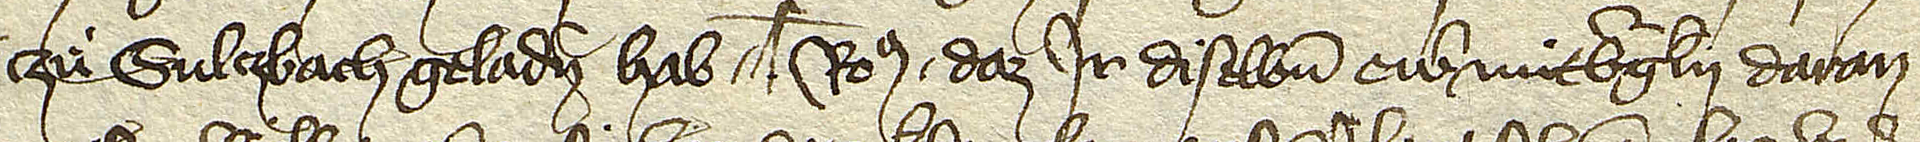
cʒü Sulcʒbach geladn* hab / Ro* / daʒ Ir diſelbn* ew* mitb*g*in daran
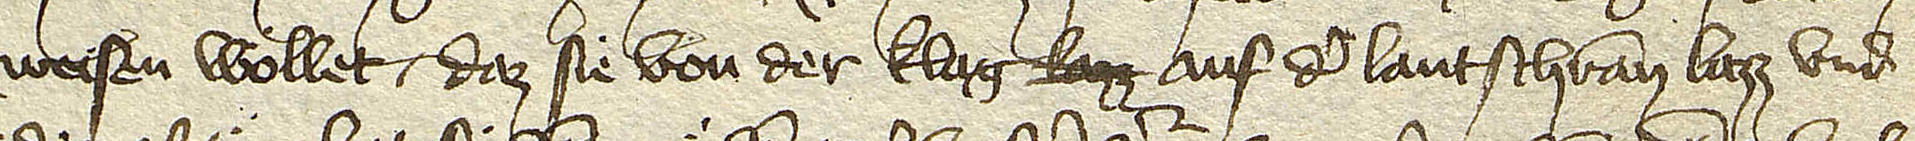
weiſen wöllet / daʒ ſie von der klag* laʒʒ auf d* lantſchran* laʒʒ vnd
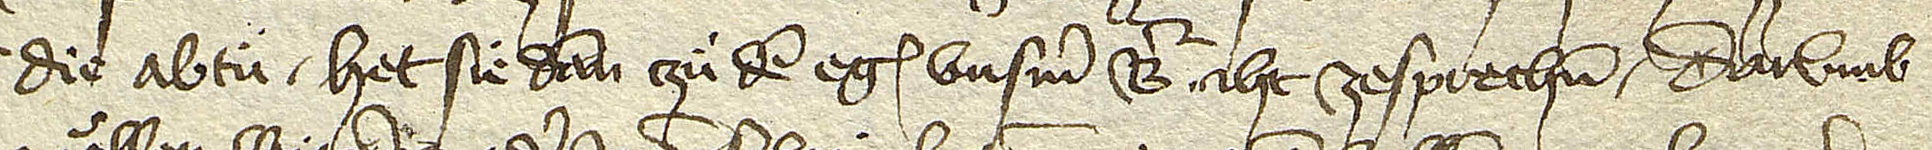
die abtü / het ſie dan* cʒü d* eg* vnſm* B* iht cʒeſprechn* / Darvmb
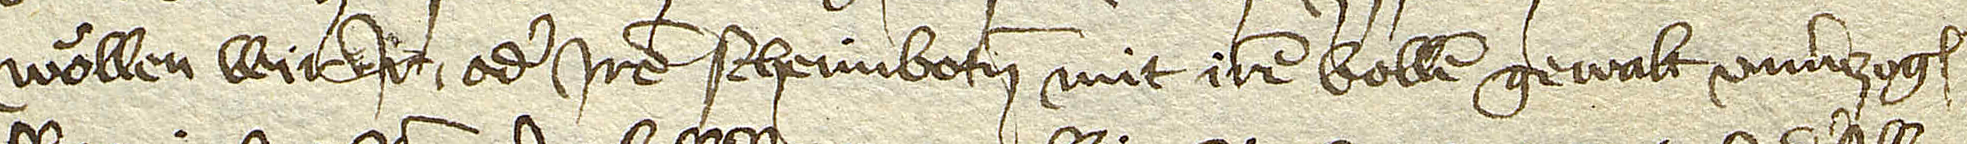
wöllen wir Ir / od* Ire* ſcheimbotn* mit ire* volle* gewalt vnu*cʒog*
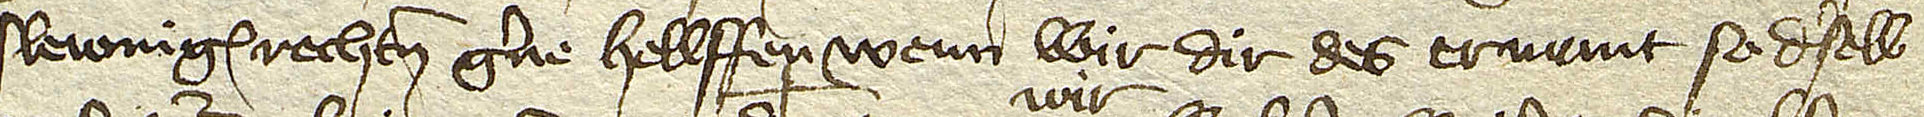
ſlewnig* rechtn* g*ne hellffen wenn wir dir des ernumt ſo d*ſelb
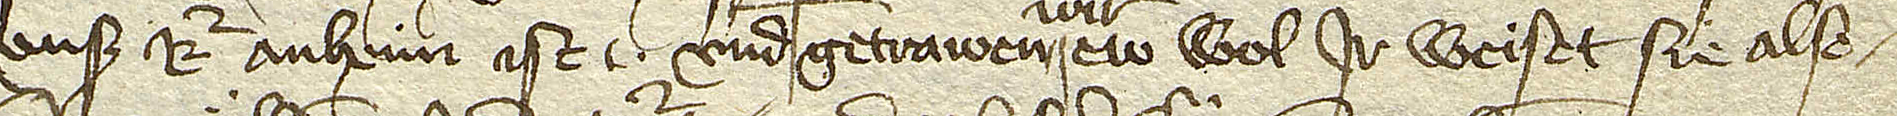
vnſ* B* anheim iſt / . vnd getrawen ew wol Ir weiſet ſie alſo /
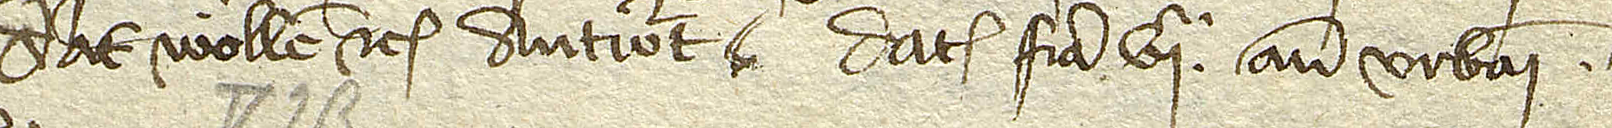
Das wölle* ec* Antwt* / dat* fia* vi* . an* vrbai* .
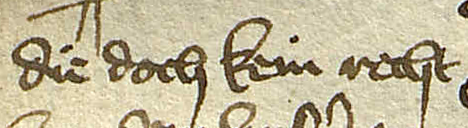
die doch kein recht
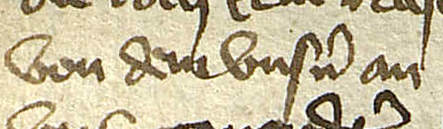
von dem vnſn* an
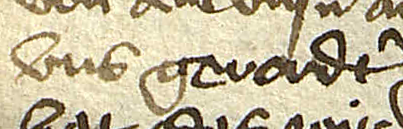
vns gevordt*
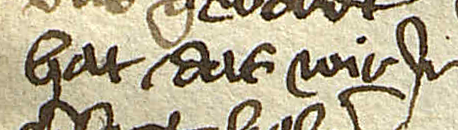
hat / das wir Ir
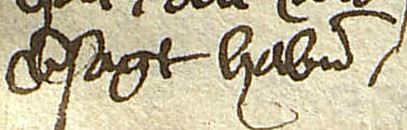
v*ſagt habn* /
